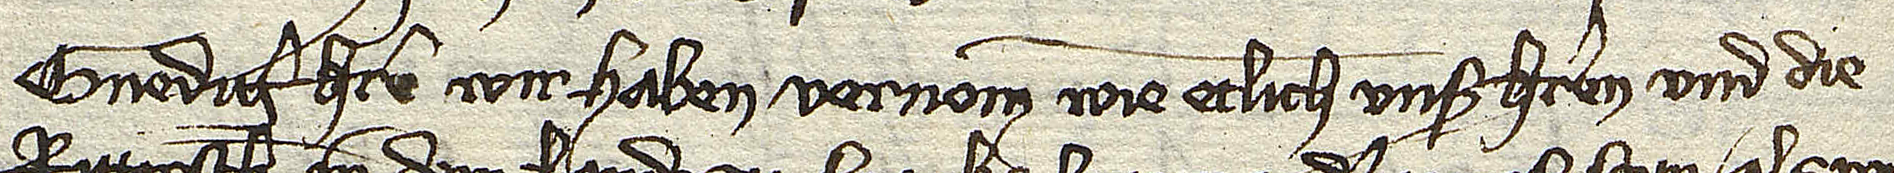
Gnedig* h*re wir haben vernom* wie etlich vnſ* hren* vnd die
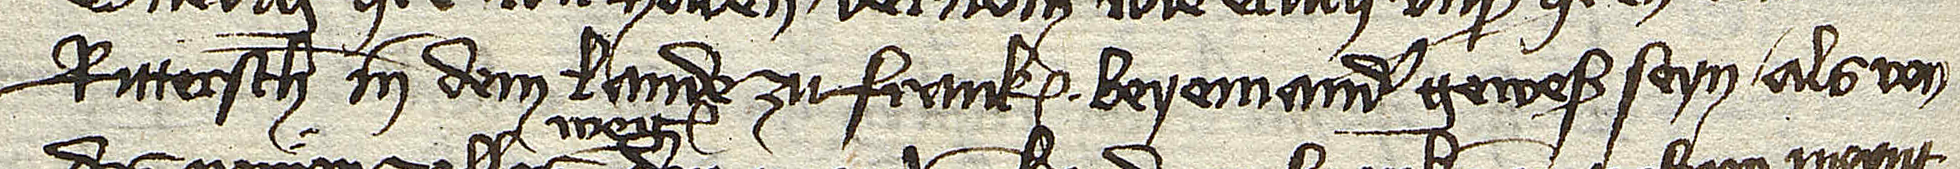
Ritterſch* In dem Lande ʒu frank* . bey einand* geweſ* ſeyn / als von
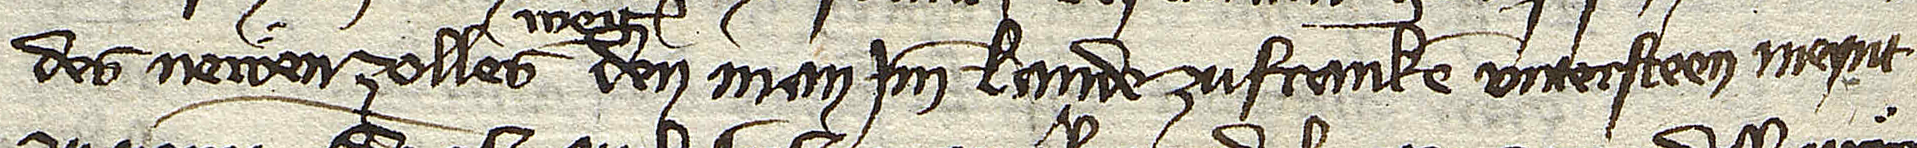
des newen ʒolles den man Im* lande ʒufranke* vnterſteen meynt
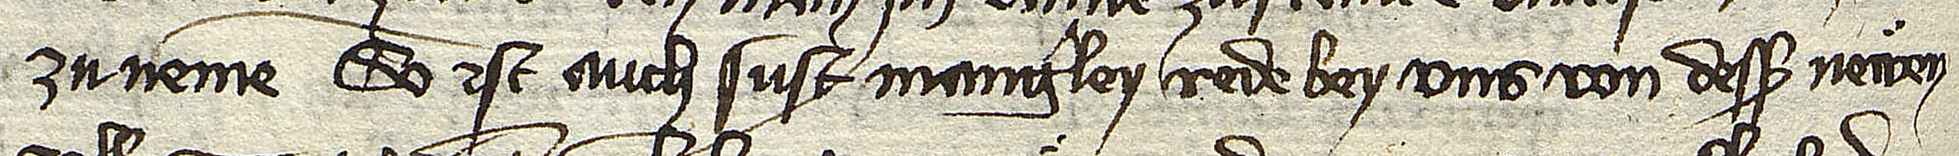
ʒu neme* So iſt auch ſuſt mang*ley rede bey vns vn deſſ* newen
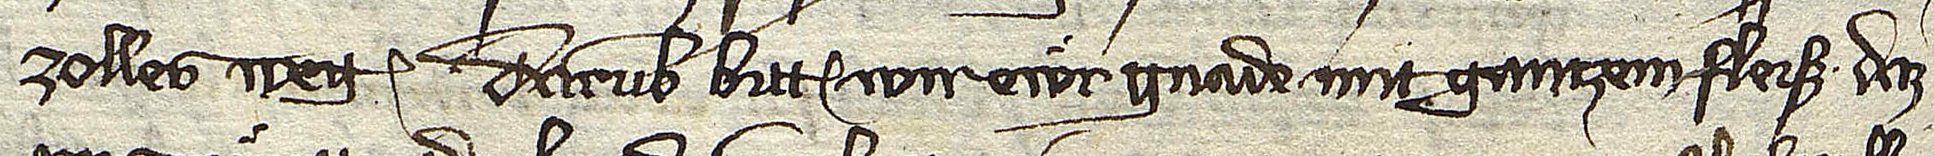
ʒolles weg* / Darub* bitt* wir ewr gnade mit ganʒem fleiſʒ . daʒ
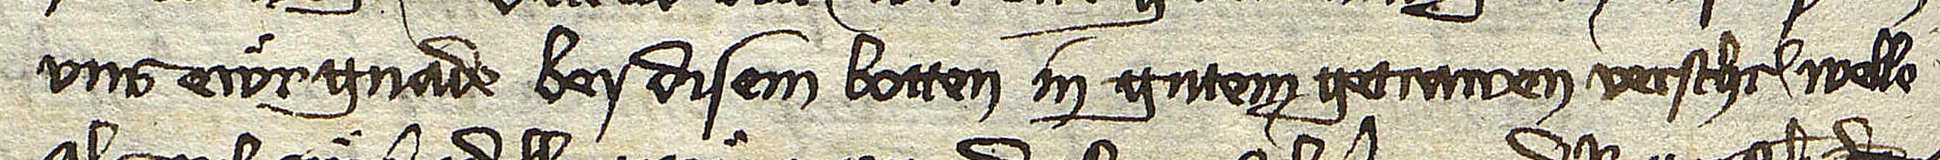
vns ewr gnade bey diſem botten in gutem getrawen verſchr* welle
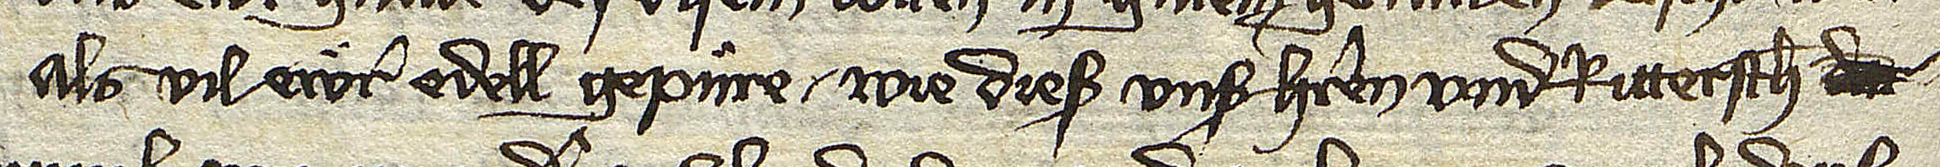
als vil ewr* edell gepüre / wie dieſ* vnſ* hren* vnd Ritterſch* dar
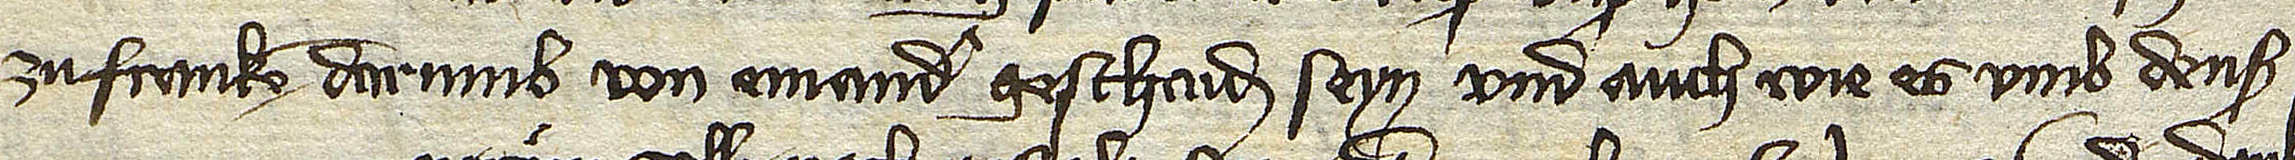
ʒu franke* / darumb von einand* geſchaid* ſeyn vnd auch wie es vmb denſ*
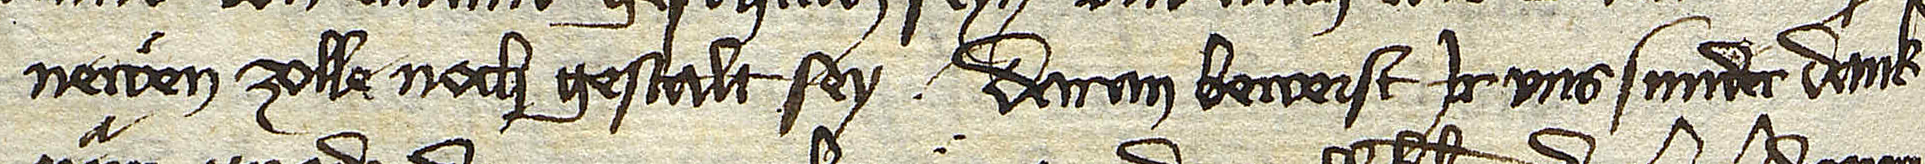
newen ʒolle noch geſtalt ſey . Daran beweiſt Ir vns ſunder dank
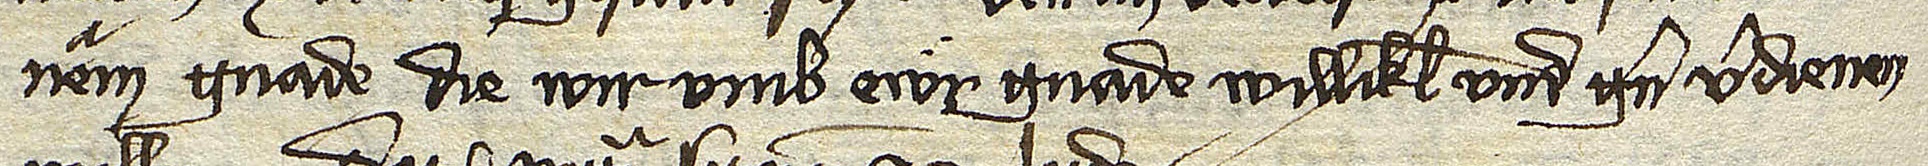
nëm gnade die wir vmb ewr gnade willikl* vnd gn* v*dienen
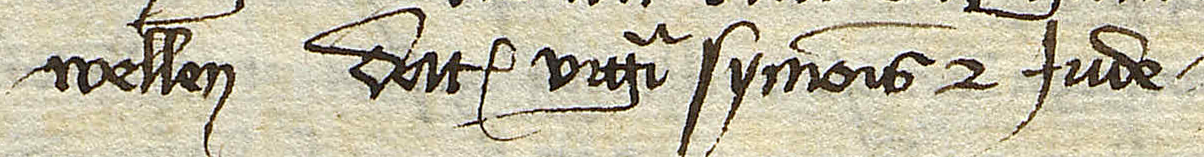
wellen Dat* vigi* ſymois* @ Iude //
